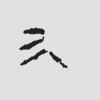天
